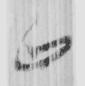㠯（以）
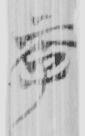{亓子}
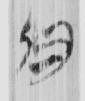於
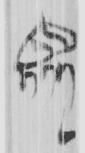眾
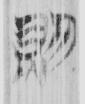則
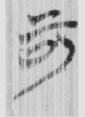可
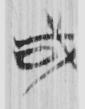或
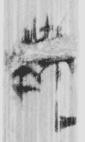{廿冉}
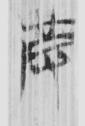皮
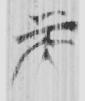天
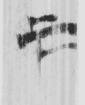下
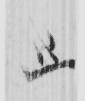之
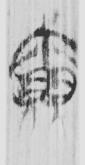{尒賏}
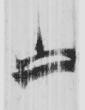士
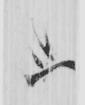之
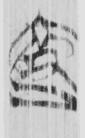{衣又止}
